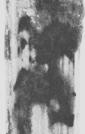﨤
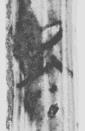𡚦
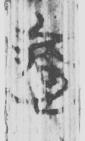𢝬
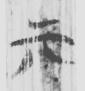亓
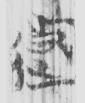﨤
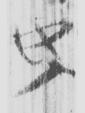𡚦
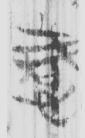𢝬
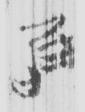唯
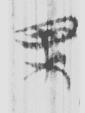果
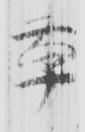{亓子}
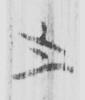之
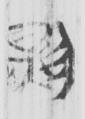則
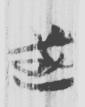或
